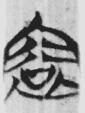裕
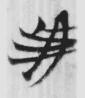我
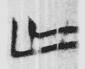亡
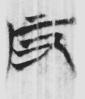反
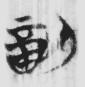副
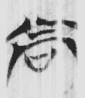尚
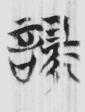諯
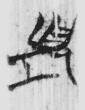項
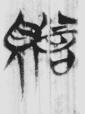{見八言}
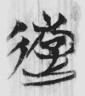遊
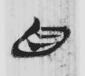目
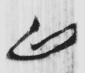㠯（以）
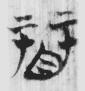{幵目}
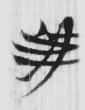我
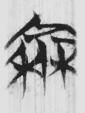秦
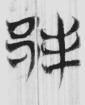邦
